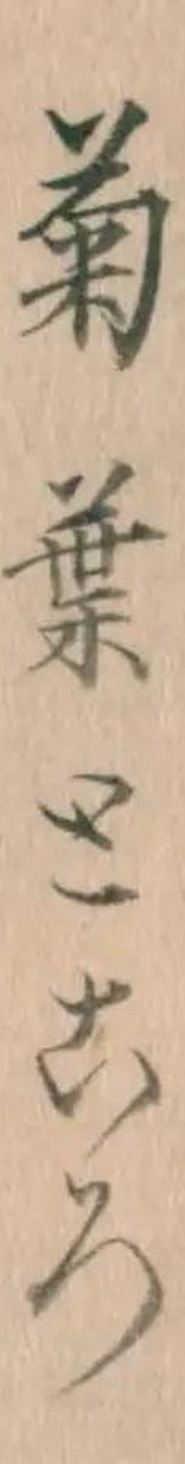菊葉ところ

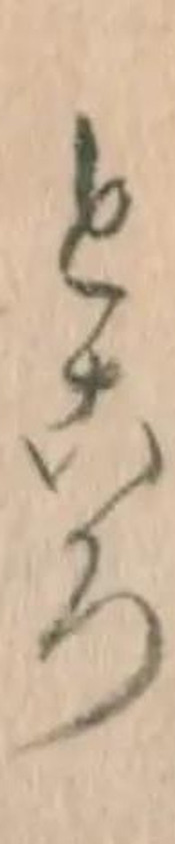ところ
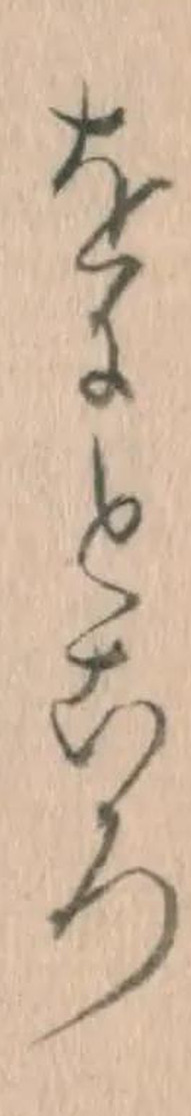をにところ

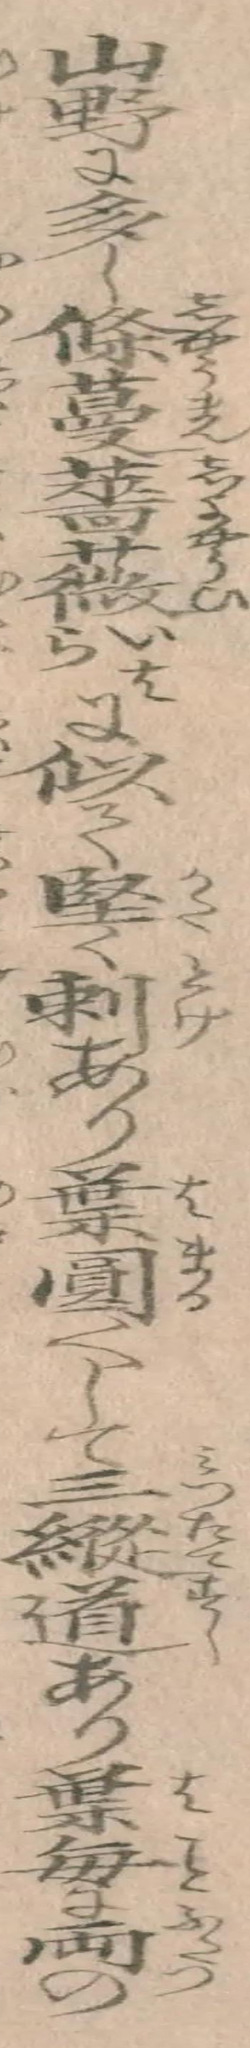山野に多し条蔓薔薇いはらに似て堅く剌あり葉円くして三縦道あり葉毎に両の
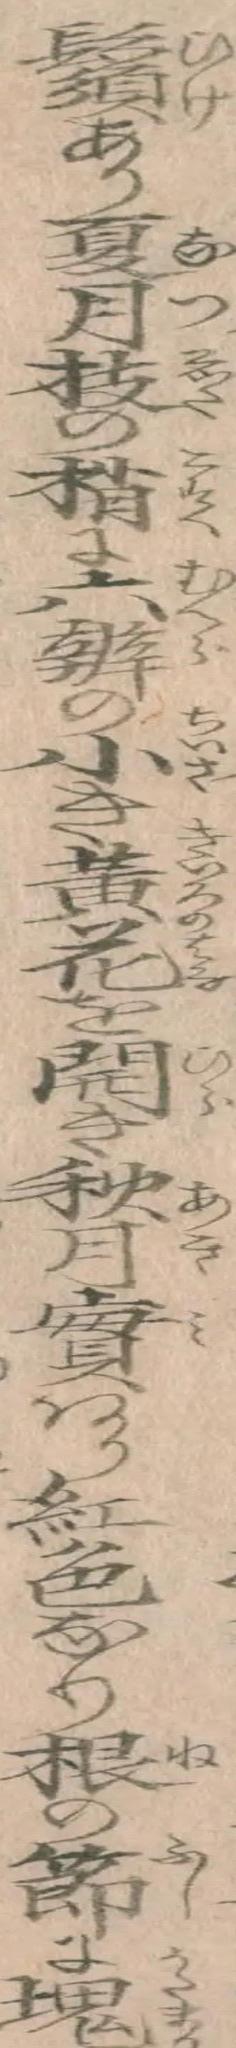鬚あり夏月枝の梢に六弁の小き黄花を開き秋月実あり紅色なり根の節に塊
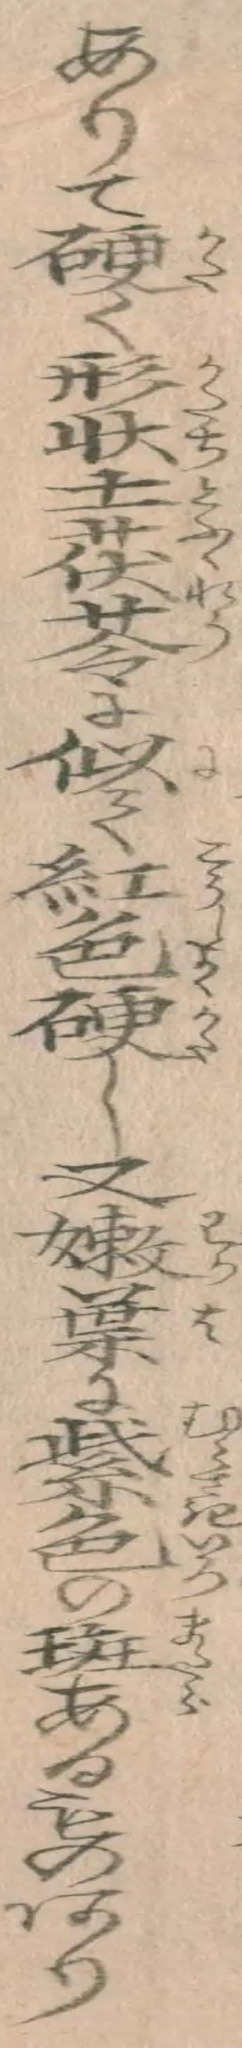ありて硬く形状土茯苓に似て紅色硬し又嫩葉に紫色の斑あるものあり
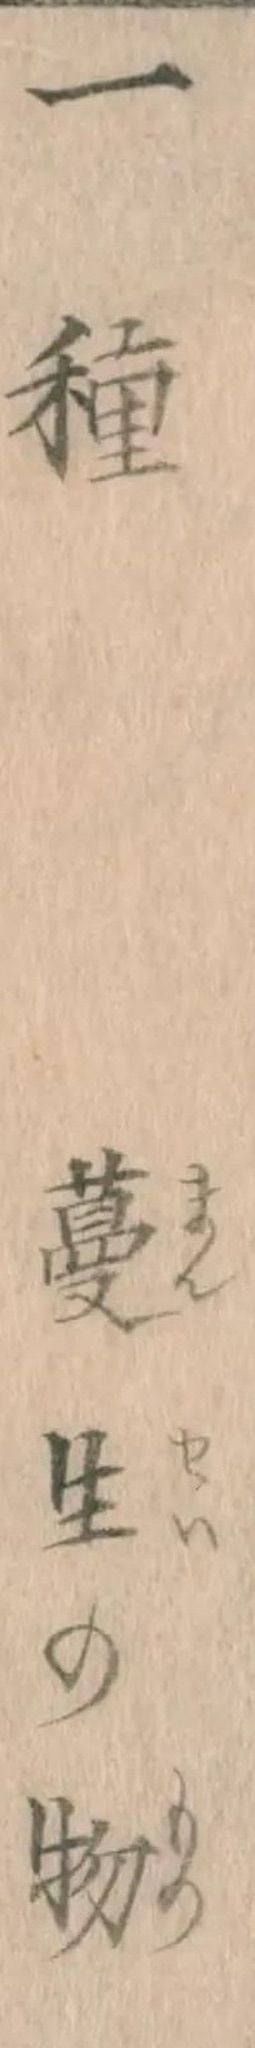一種蔓生の物
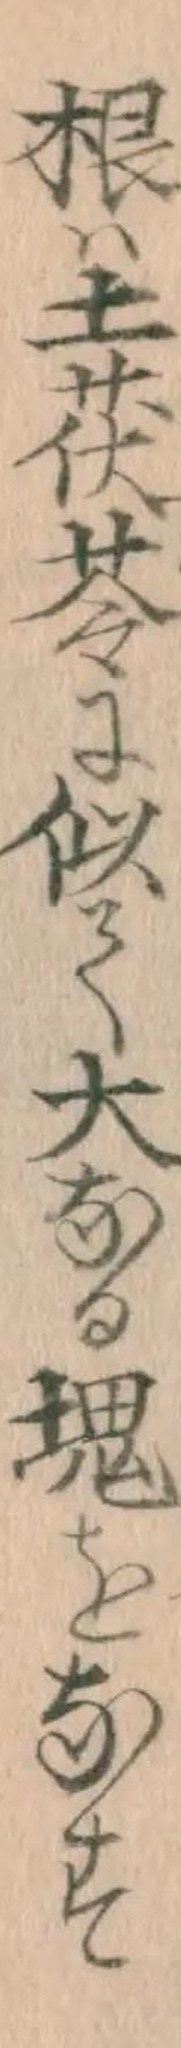根は土茯苓に似て大なる塊をなす
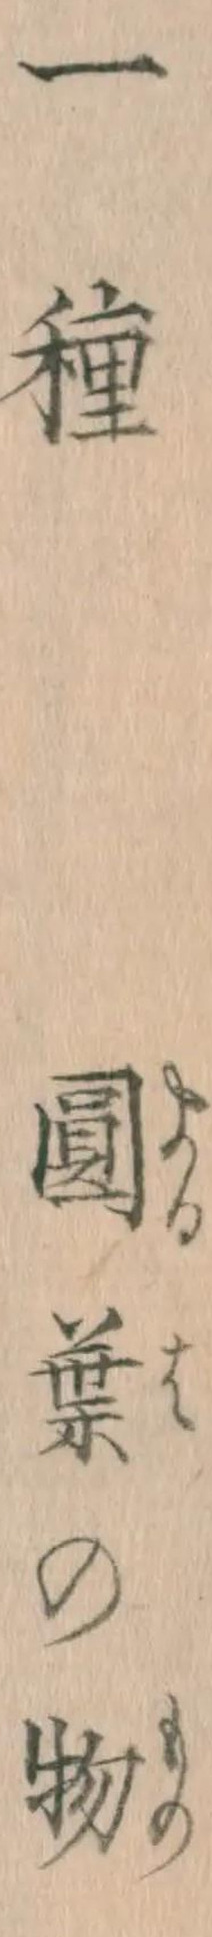一種円葉の物
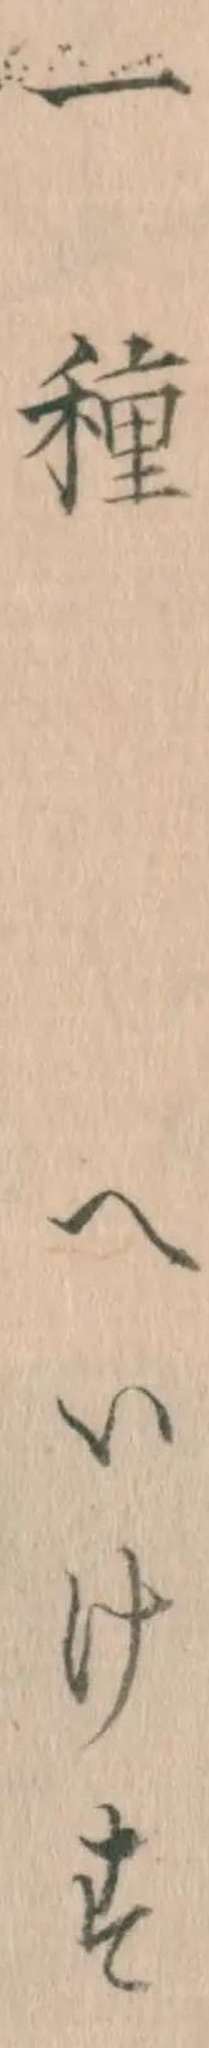一種へいけす
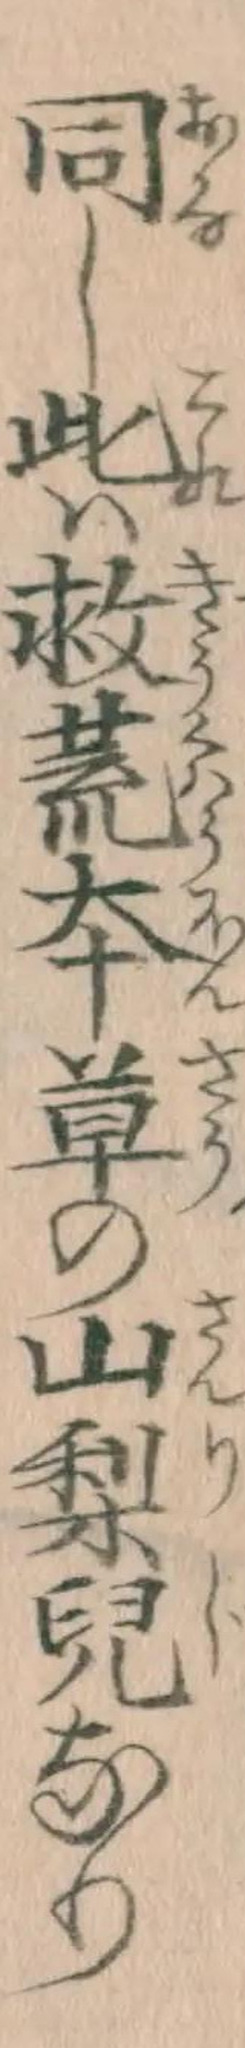同し此は救荒本草の山梨児なり
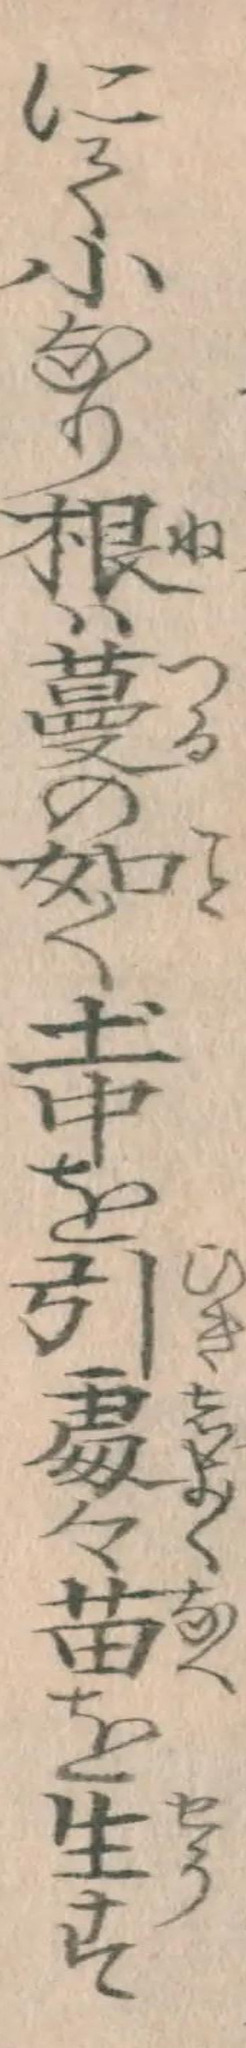にて小なり根は蔓の如く土中を引処々苗を生す

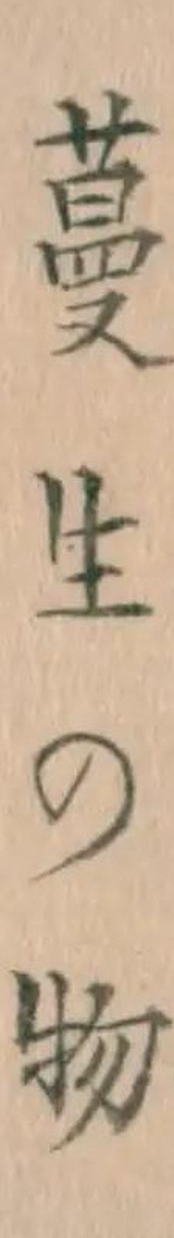蔓生の物
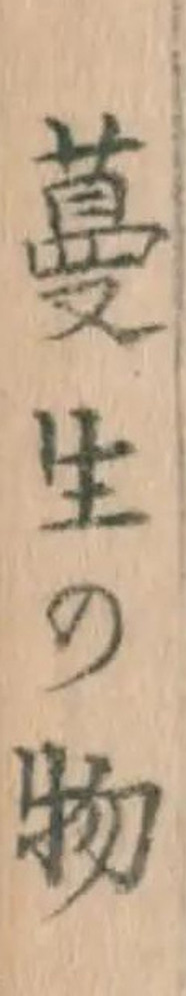蔓生の物

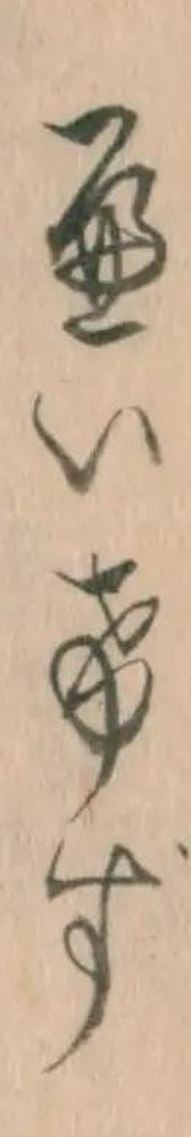へいけず
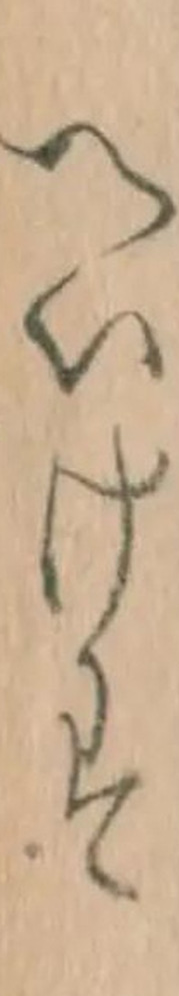へいけす
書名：本草図譜. 巻28-30
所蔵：国立国会図書館 National Diet Library, JAPAN
